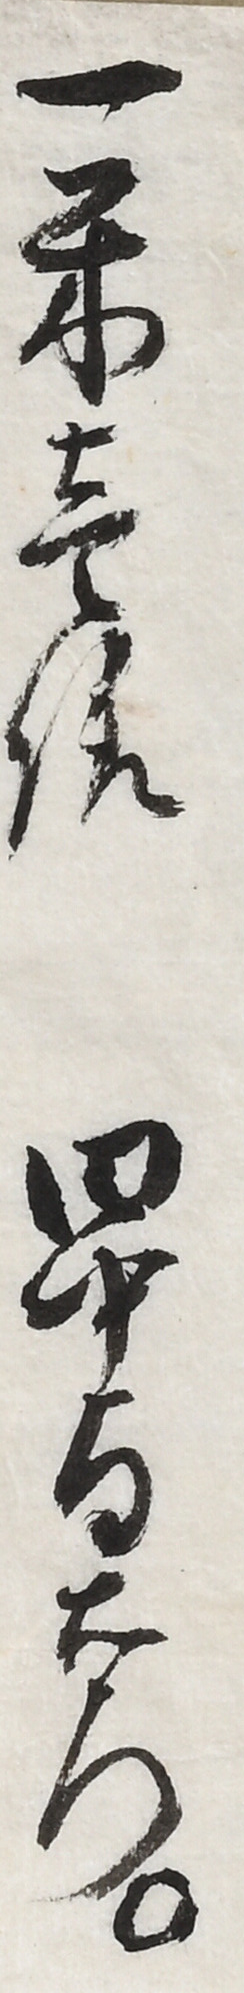一米壱俵田中与右衛門〇
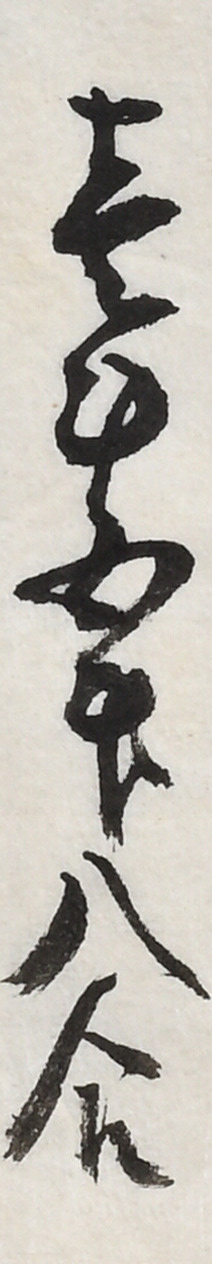壱斗五升八合
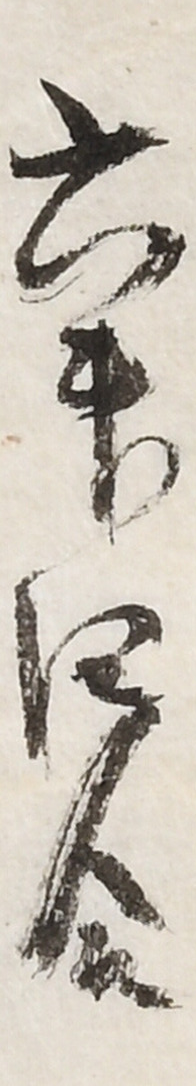六升四合
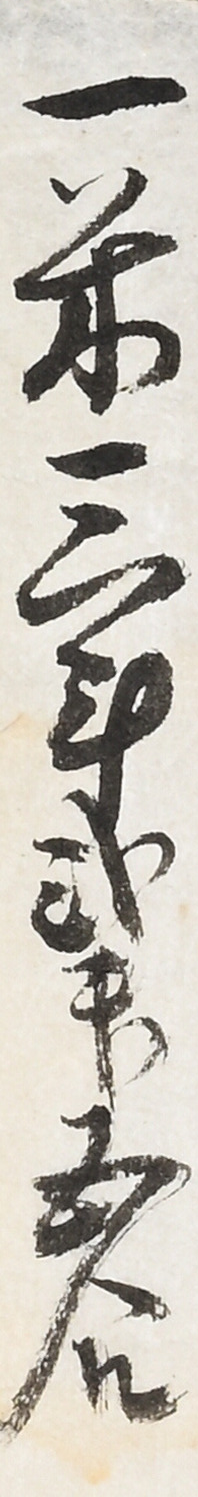一米三斗弐升五合
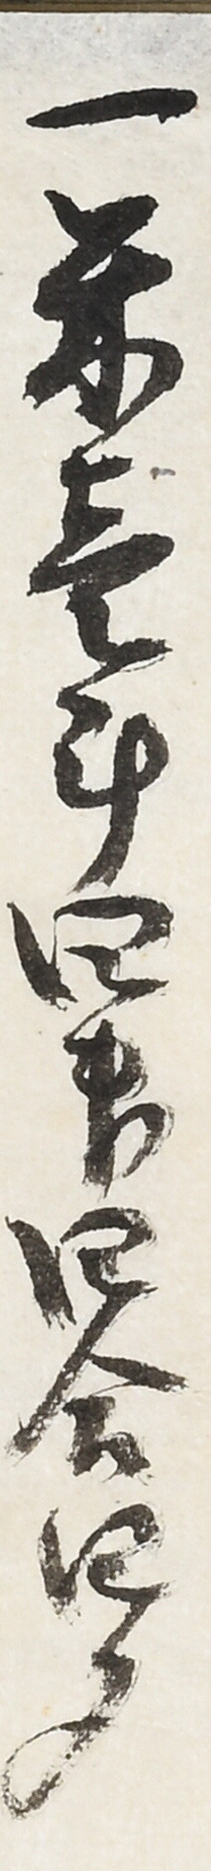一米壱斗四升四合四勺
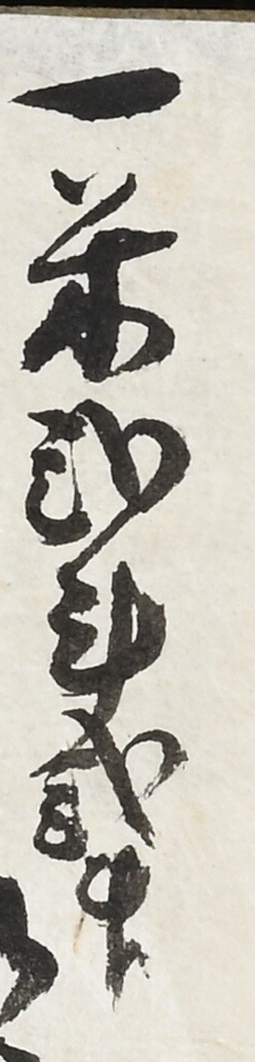一米三斗弐升五合
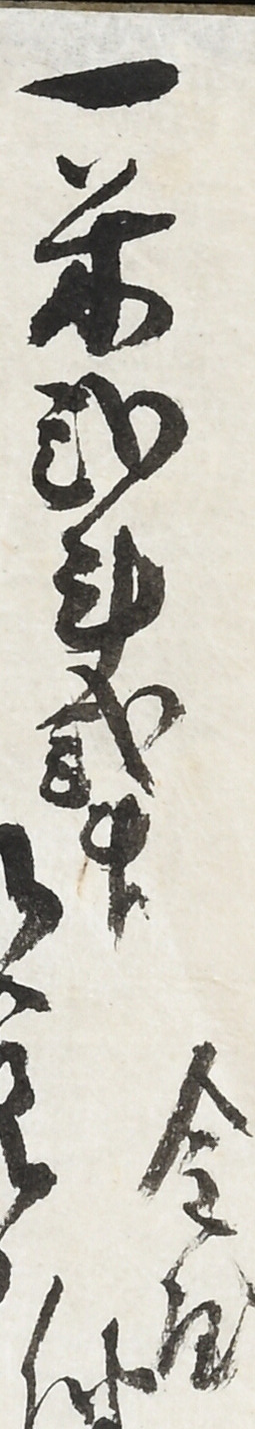一米三斗弐升五合

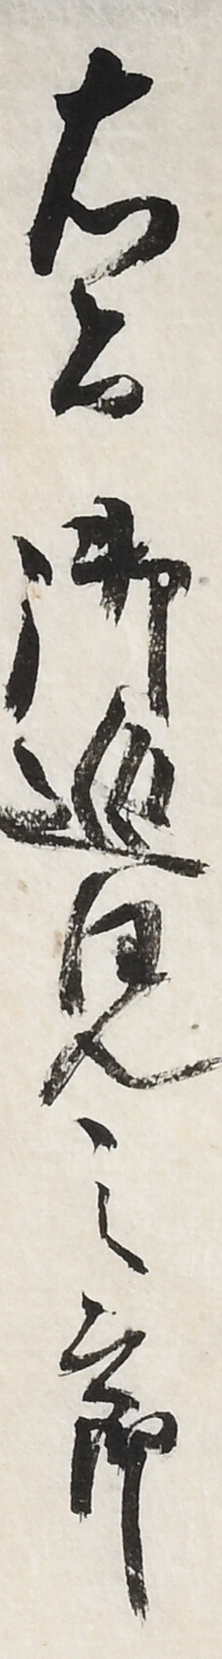右者御巡見之節
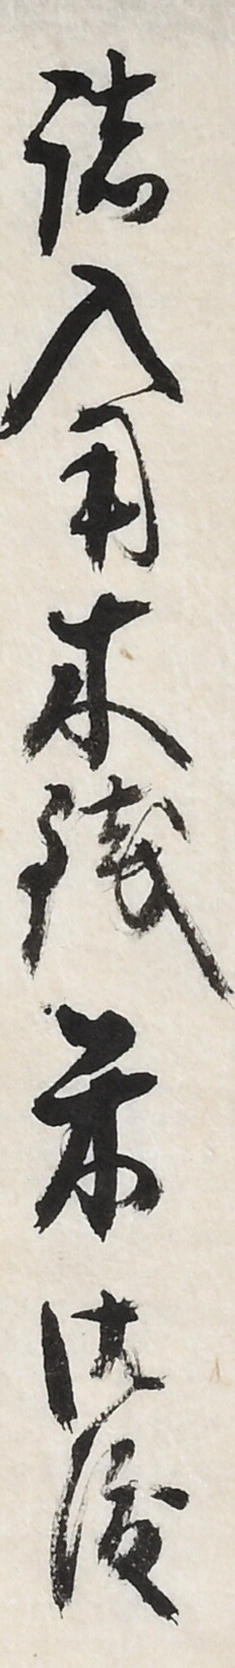諸入用木銭米御渡
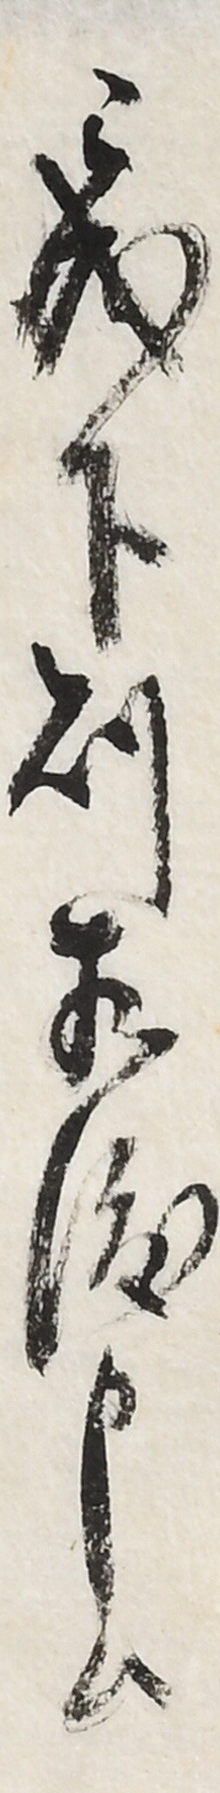被成下則相渡申候
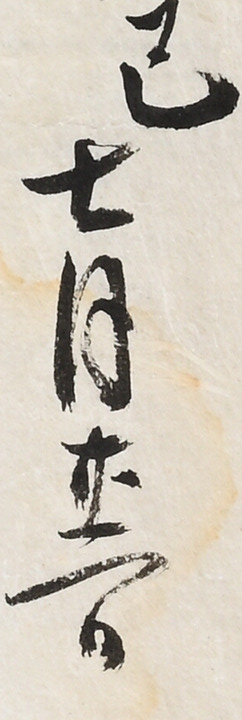巳七月廿二日

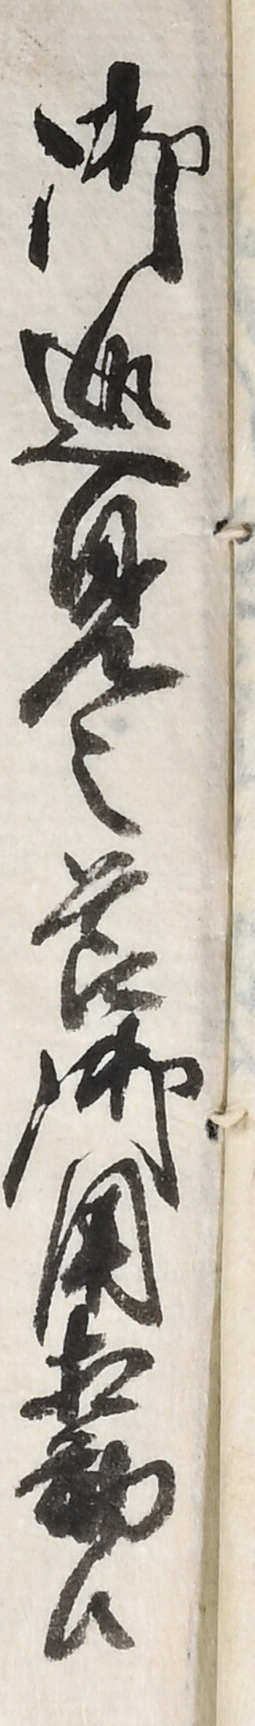御巡見之節御用相勤候
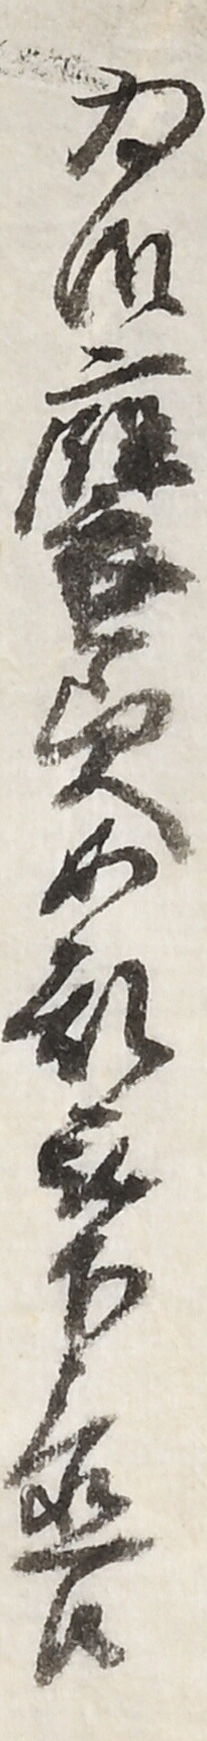為御褒美如斯被下置候
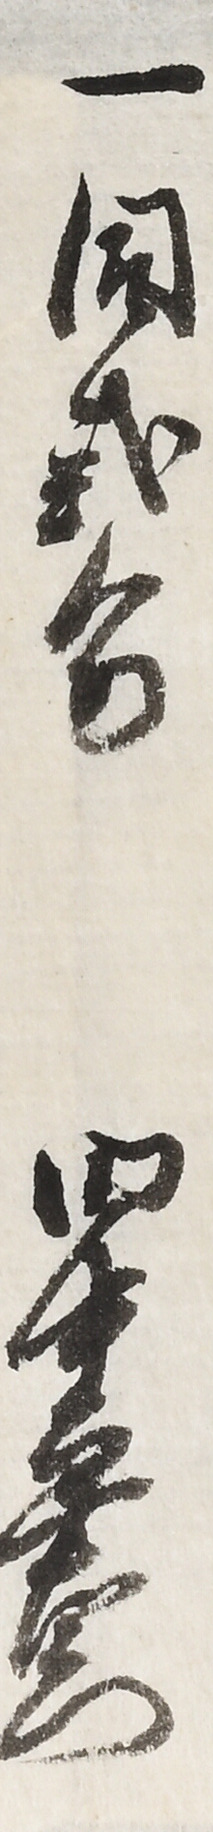一同弐分田中与右衛門
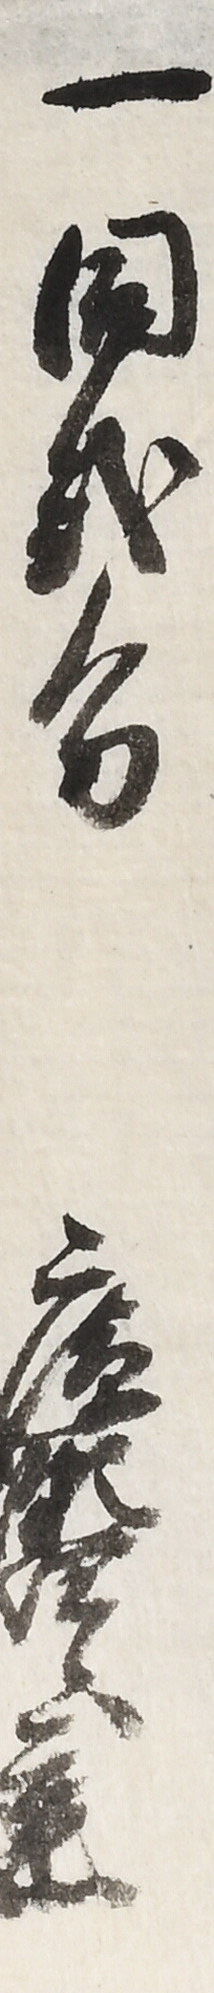一同弐分広瀬四郎兵衛
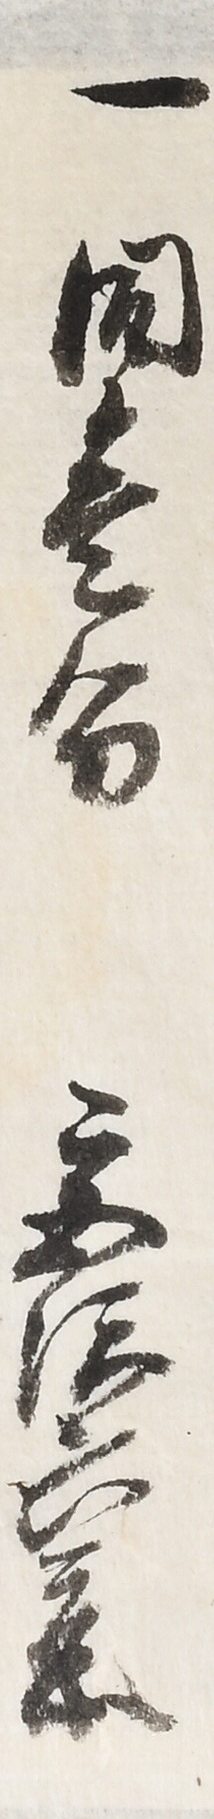一同壱分宮沢六兵衛
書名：覚
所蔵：伊那市立高遠町図書館・合同会社AMANE
